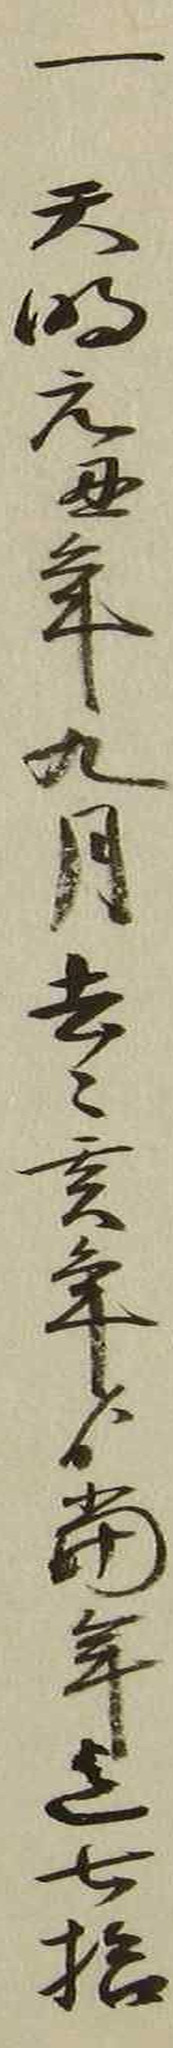一天明元丑年九月去々亥年ゟ当年迄七拾
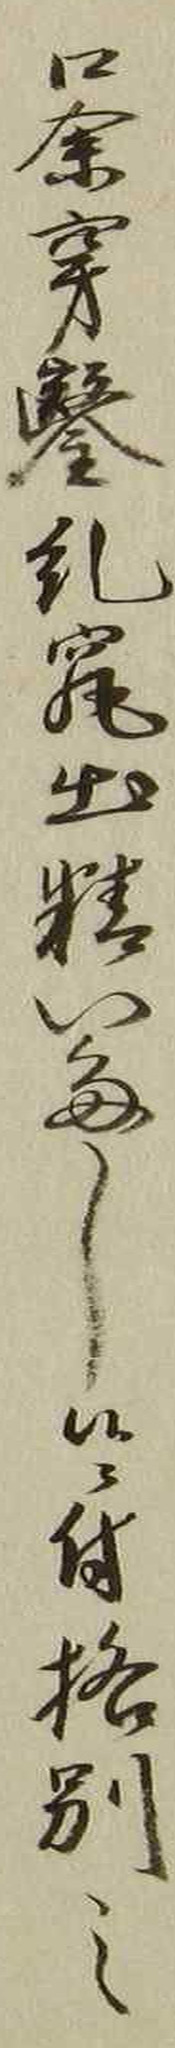口余穿鑿糺究出精いたし候ニ付格別之
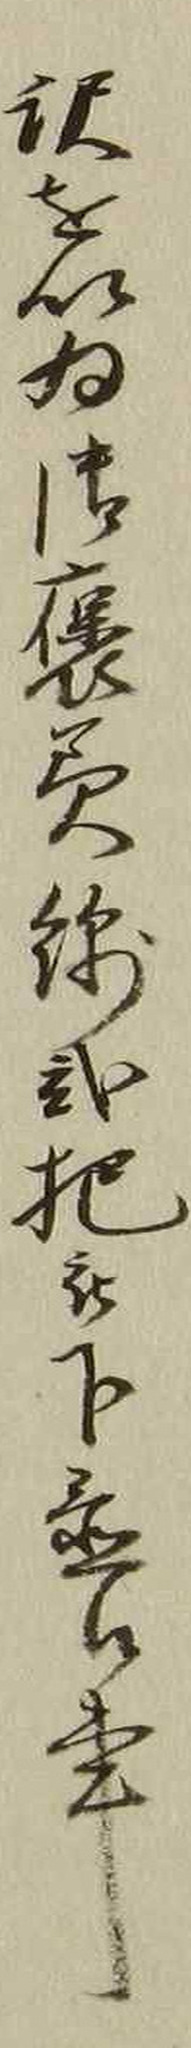訳を以為御褒美綿弐把被下置候事
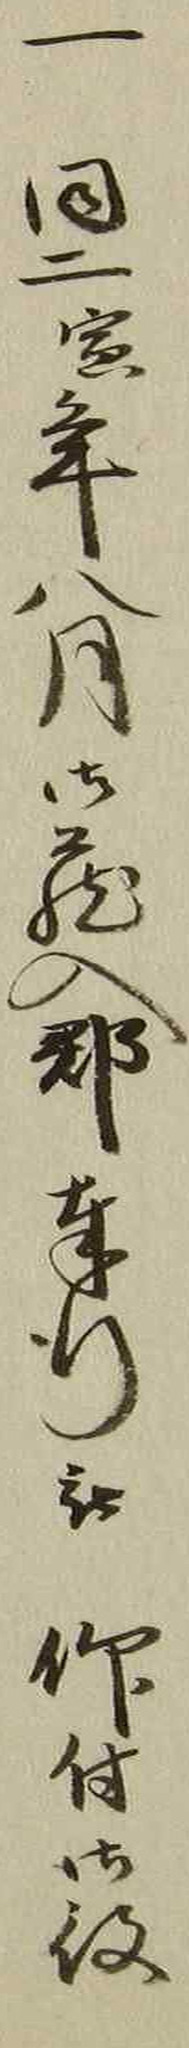一同二寅年八月御蔵入郡奉行被仰付御役
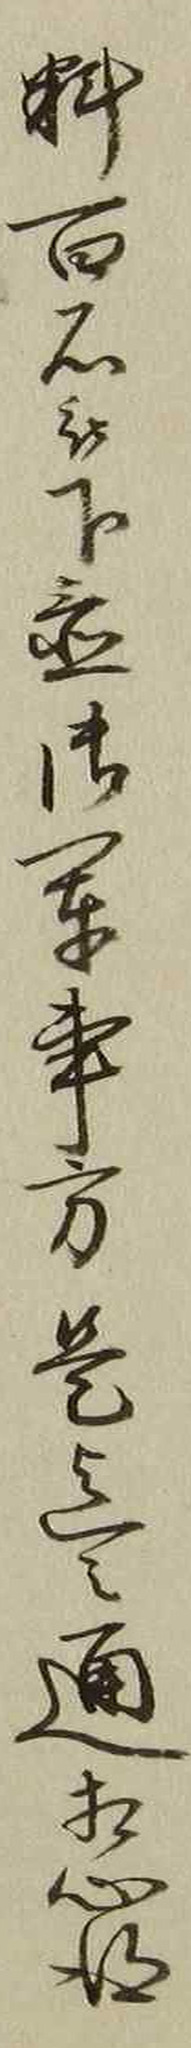料百石被下置御軍事方是迄之通相心得
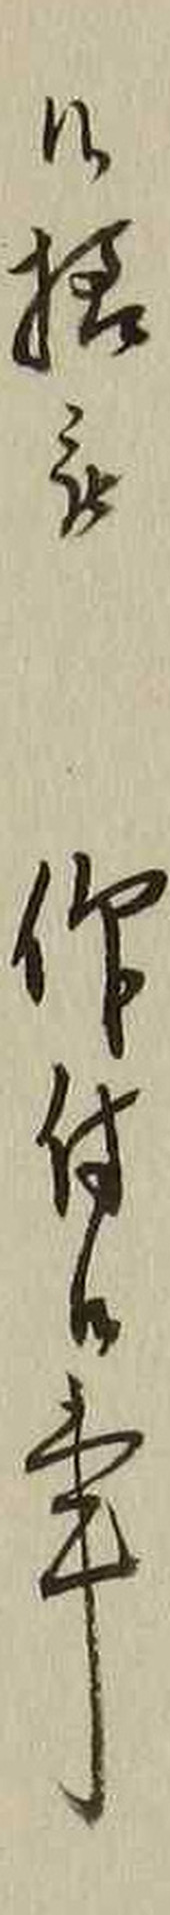候様被仰付候事
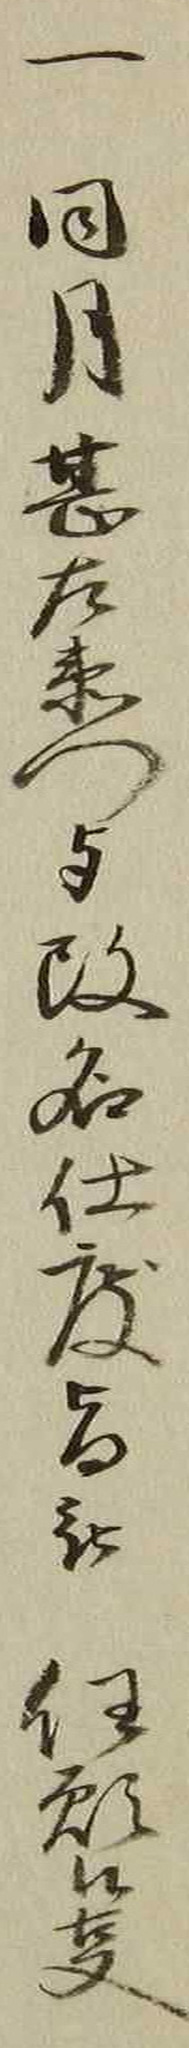一同月甚左衛門与改名仕度旨被任願候事
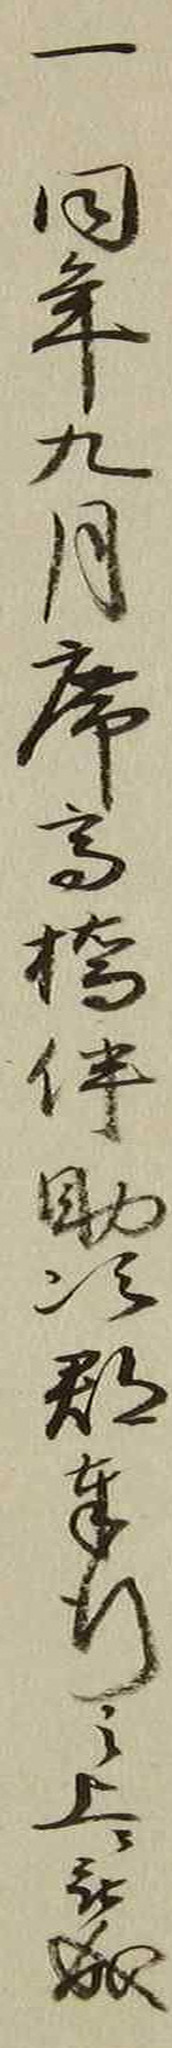一同年九月席高橋伴助次郡奉行之上ニ被成
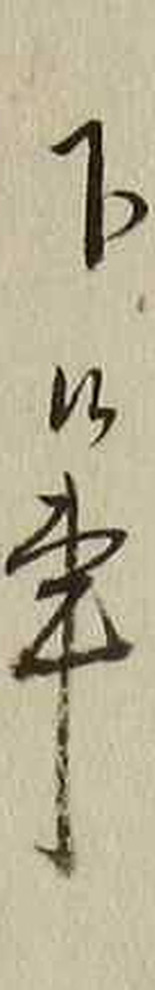下候事
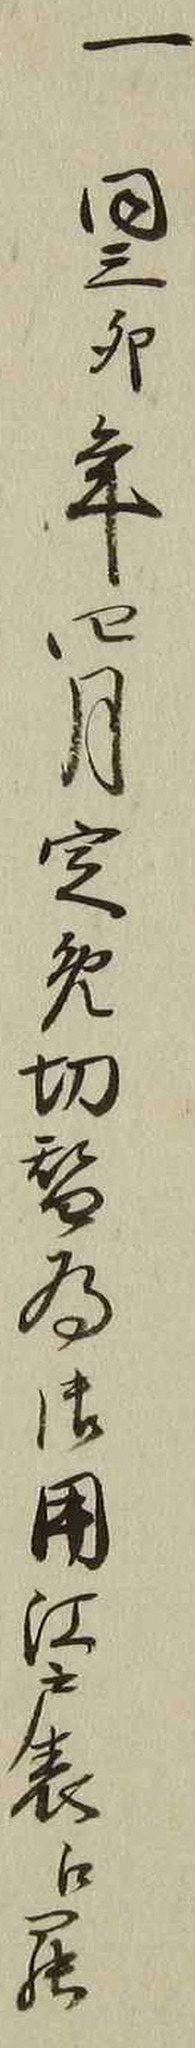一同三卯年四月定免切替為御用江戸表江罷
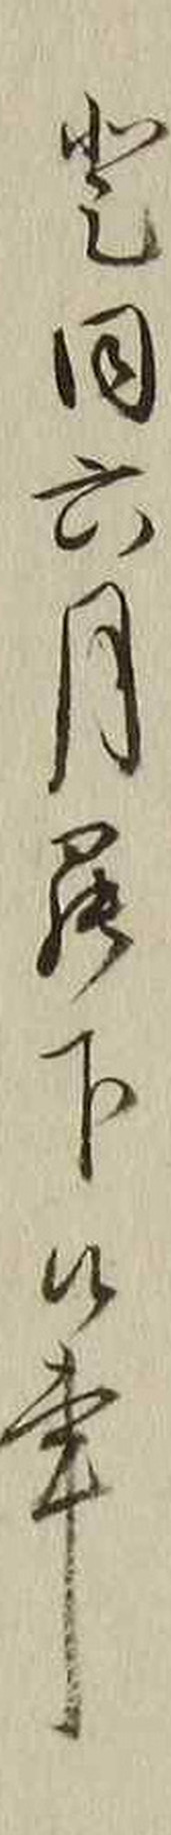登同六月罷下候事
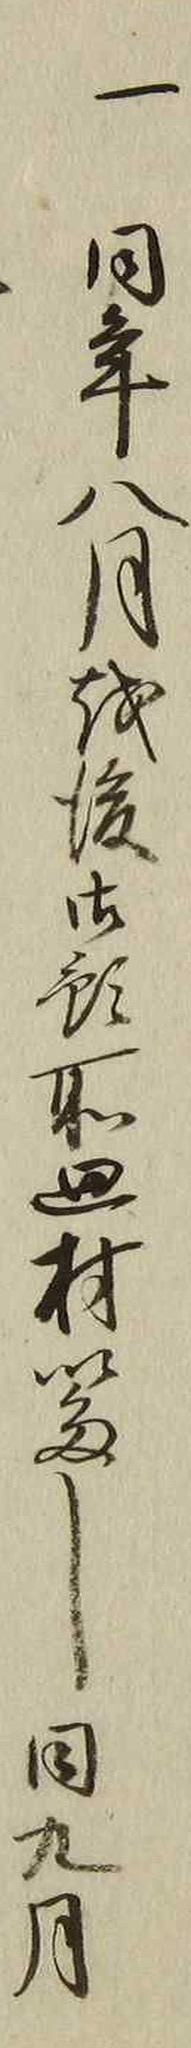一同年八月越後御預所廻村いたし同九月
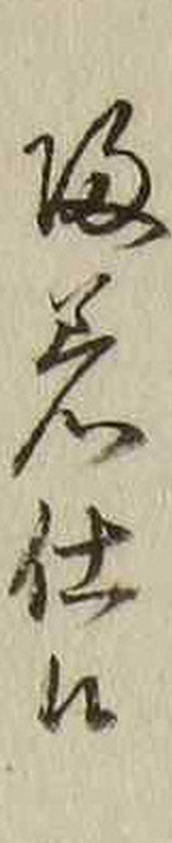帰着仕候
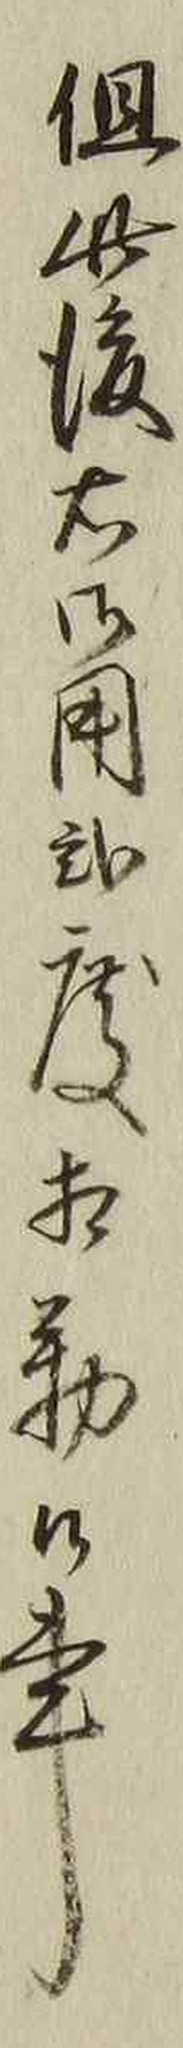但此後右御用弐度相勤候事
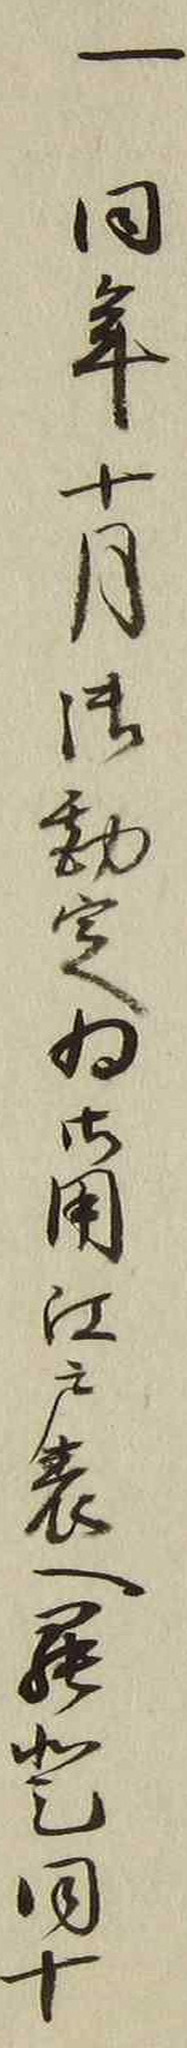一同年十月御勘定為御用江戸表へ罷登同十
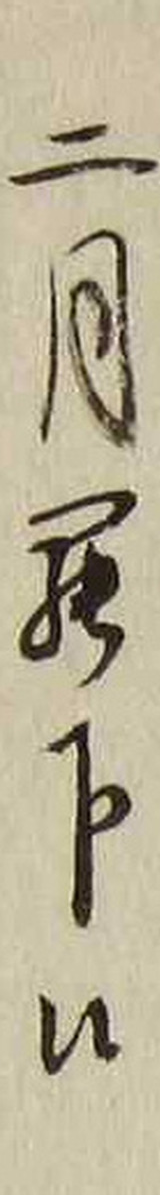二月罷下候
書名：諸士系譜　巻之128　た之部4
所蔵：会津若松市立会津図書館
